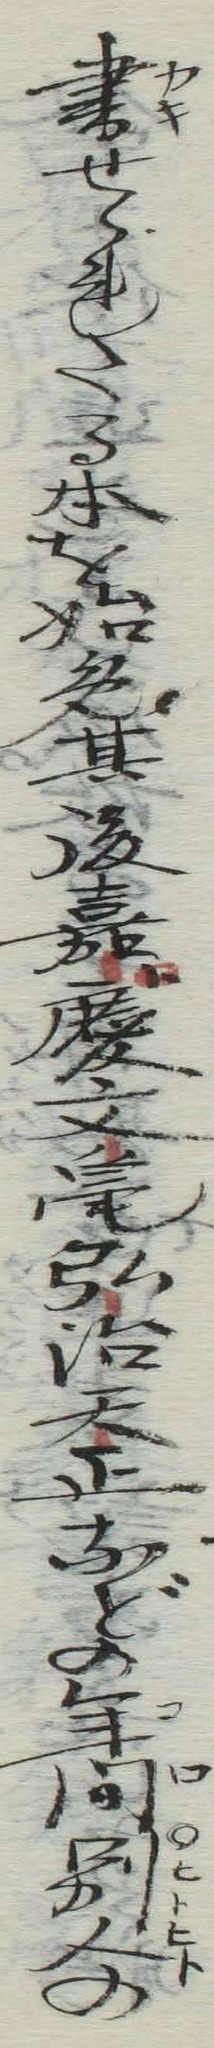書せられたる本を始め其後嘉-慶文-亀弘-治天-正などの年間。別人の
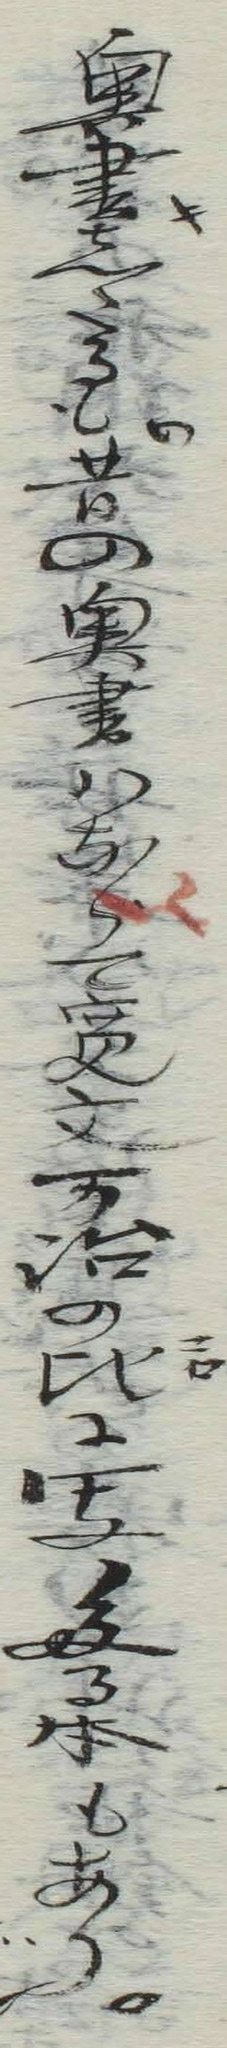奥書したるも。昔の奥書はなくて寛文万治の比に写たる本もあり。
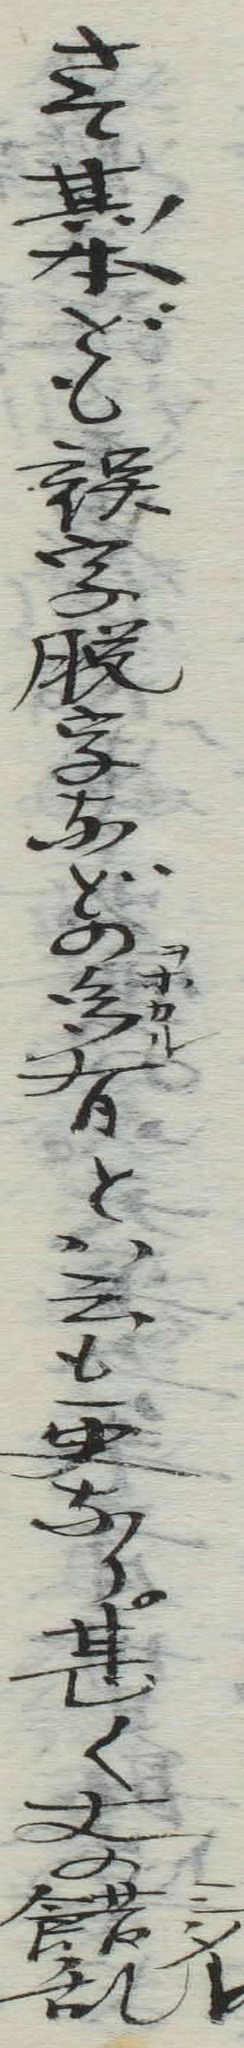さて其本ども誤字脱字などの多有とは云も一史なり。甚く丈の錯乱
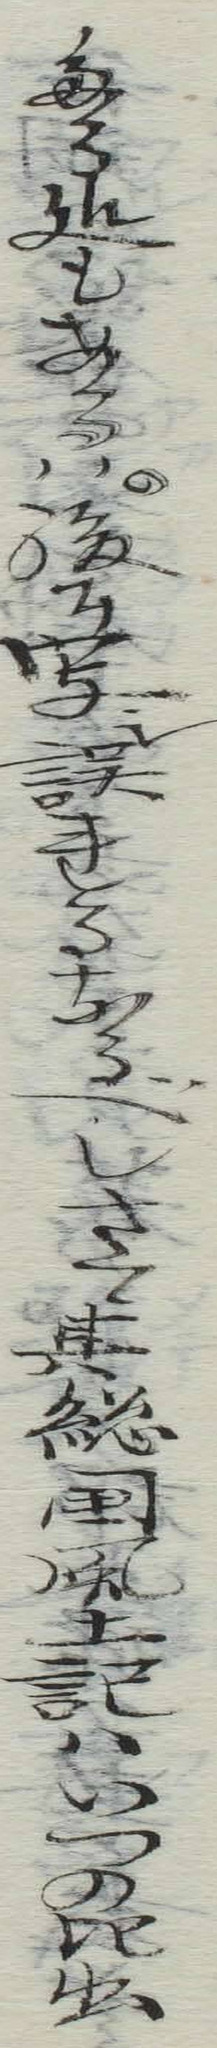たる処もあるは。後に写誤れるなるべしさて其総国風土記はいつの比出
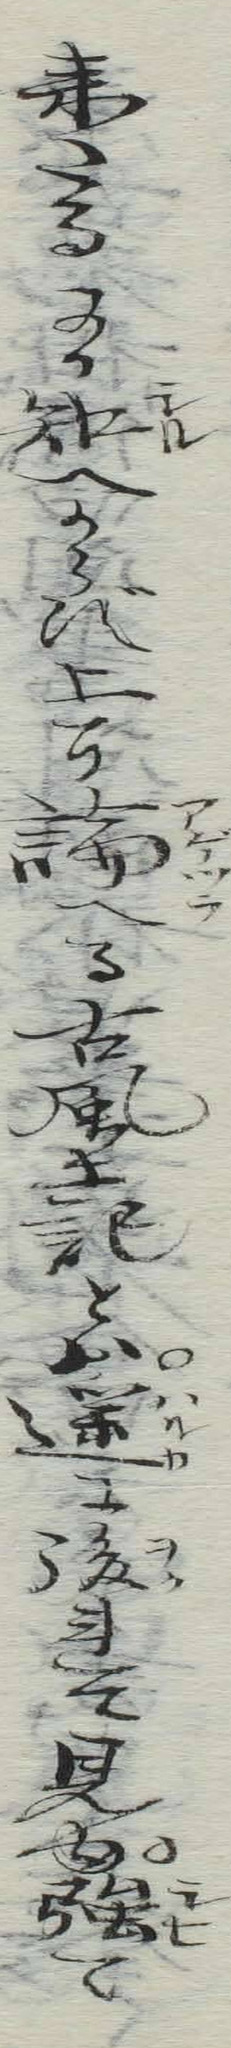来たるにか知へからず上に論へる古風土記とは。遥に後れて見ゆ。強て
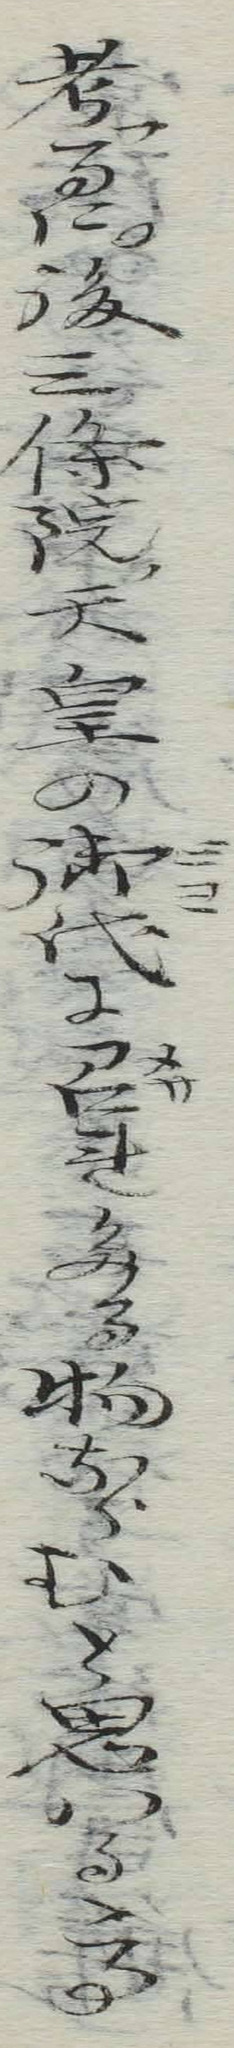考るに。後三条院天皇の御代に召れたる物ならむと思はるゝ事
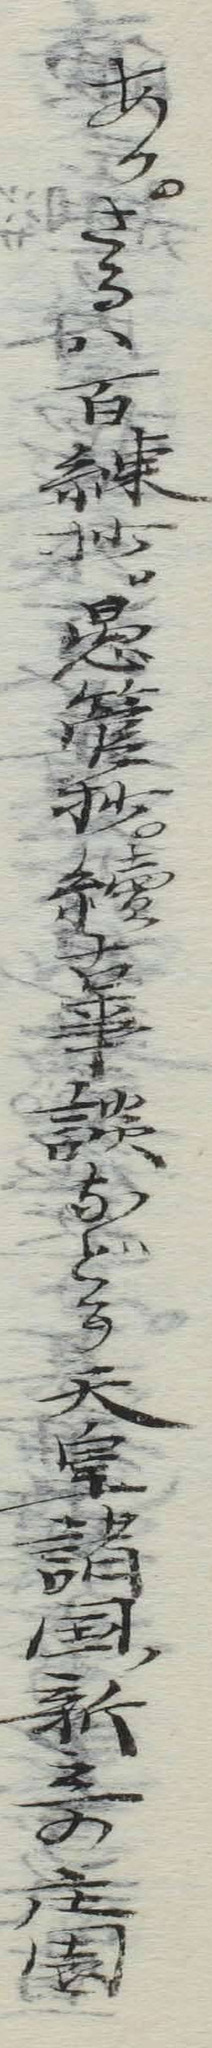あり。さるは百練抄。愚管抄。続古事談などに天皇諸国新奇庄園
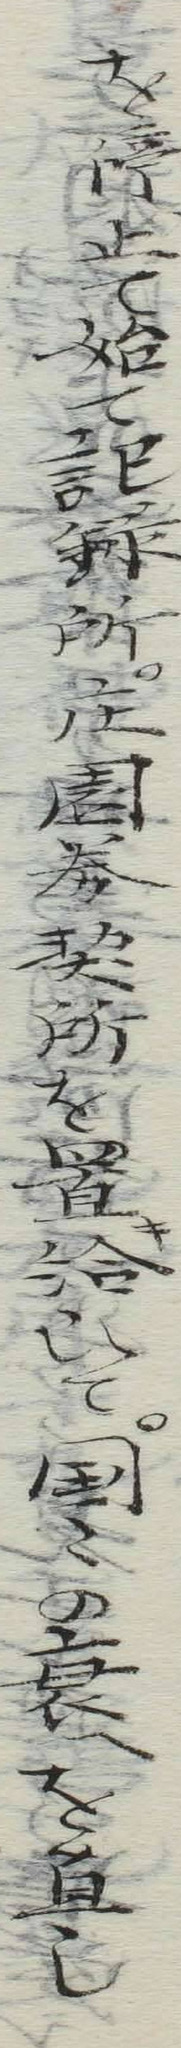を停止て始て記録所。庄園券契所を置給ひて。国々の衰を直し
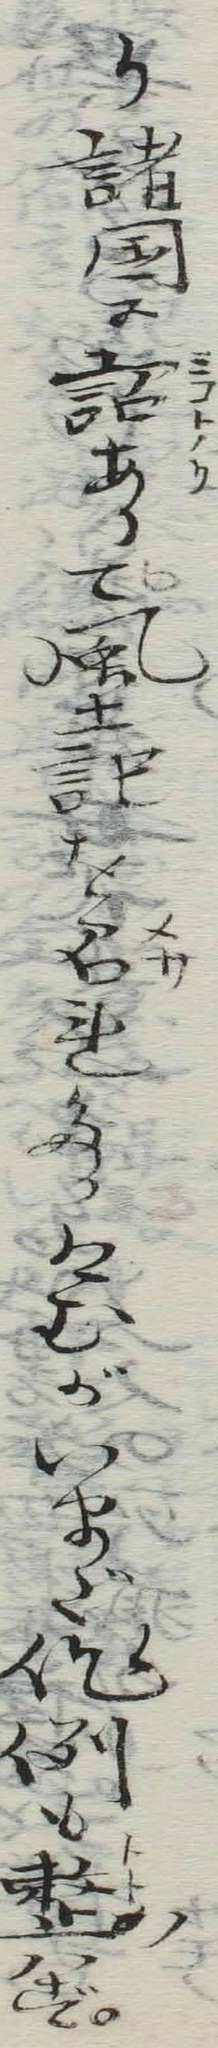に諸国に詔ありて風土記を召れたりけむがいまだ作例も整はず。
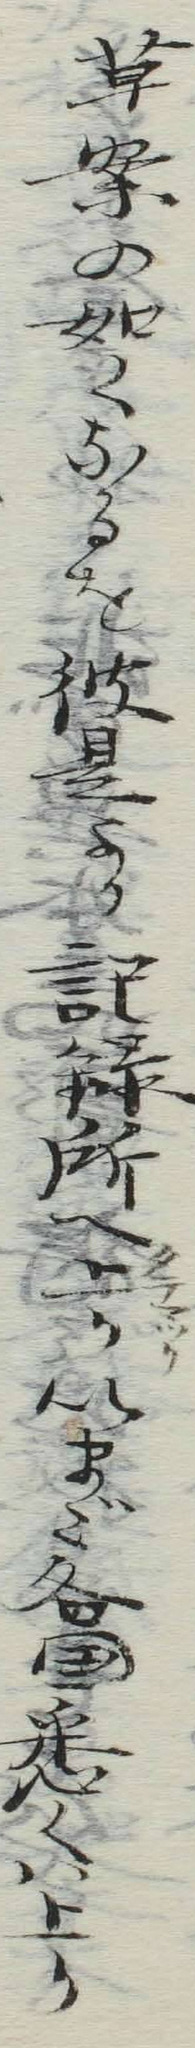草案の如くなるを彼是より記録所へ上りいまだ各国悉くは上り
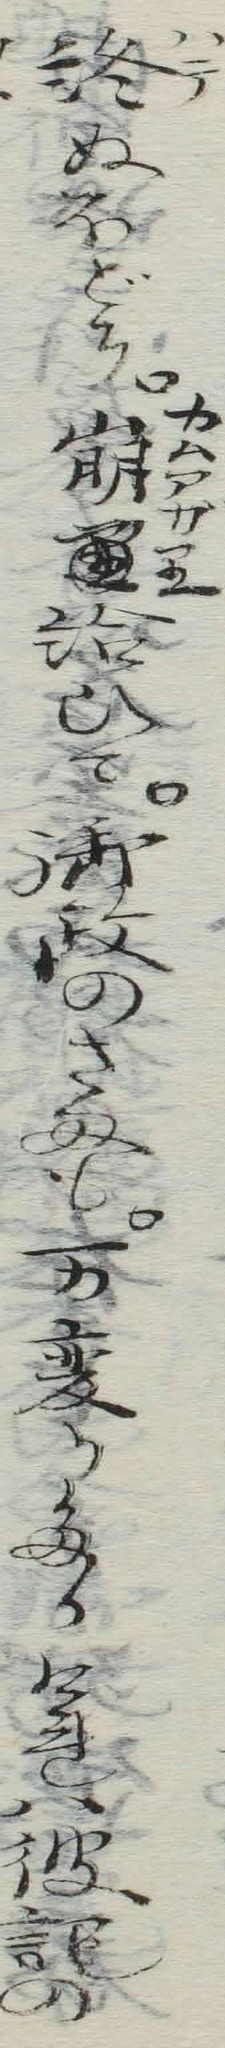終ぬほどに。崩り給ひて。御政のさまも。万変りたりけれは彼記の
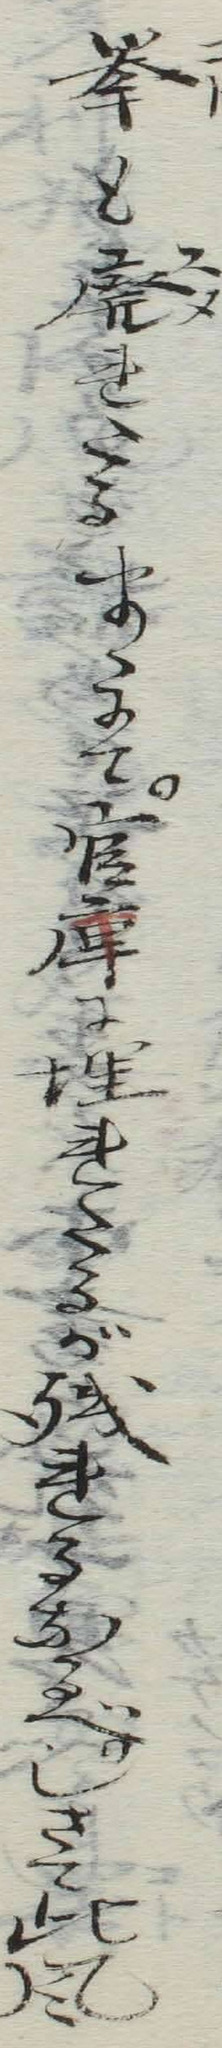挙も廃れたるまゝにて。官庫に埋れたるが残れるなるべし。さて此風
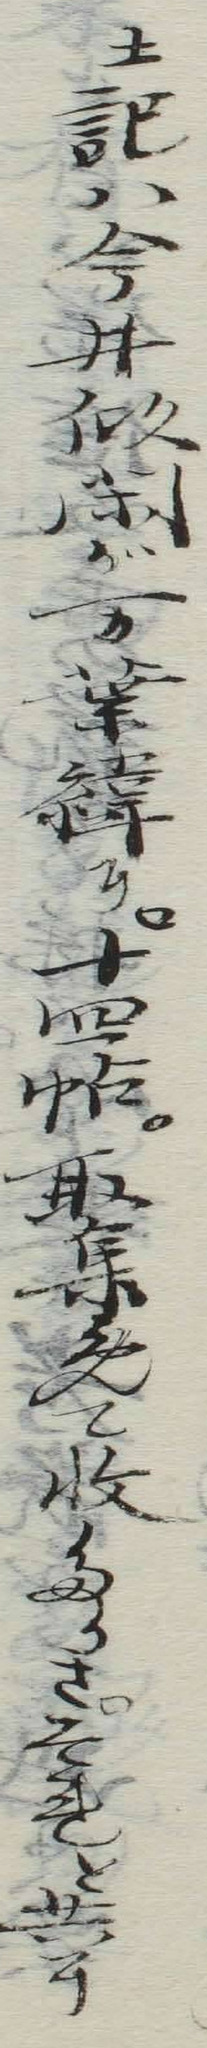土記は今井似閑が万葉緯に。十四帖。取集めて収たりき。それと共に

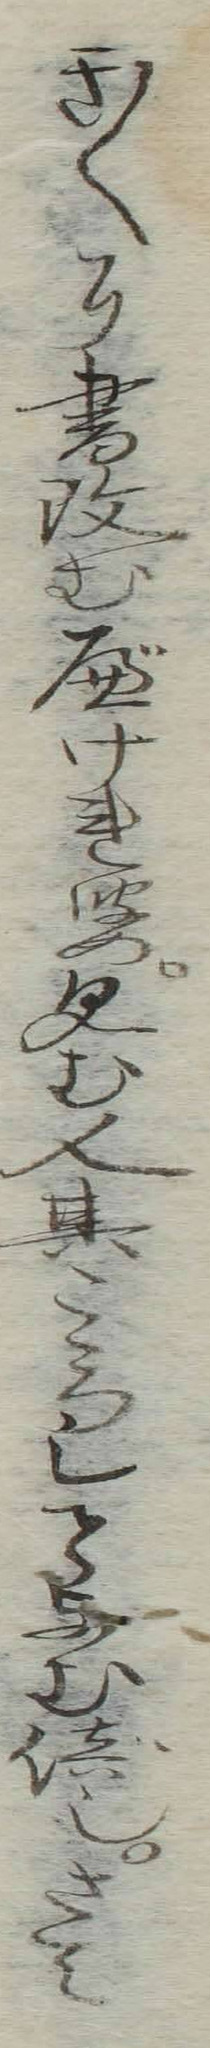き〳〵に書改むべければ見む人其こゝろしてよむべし。さて
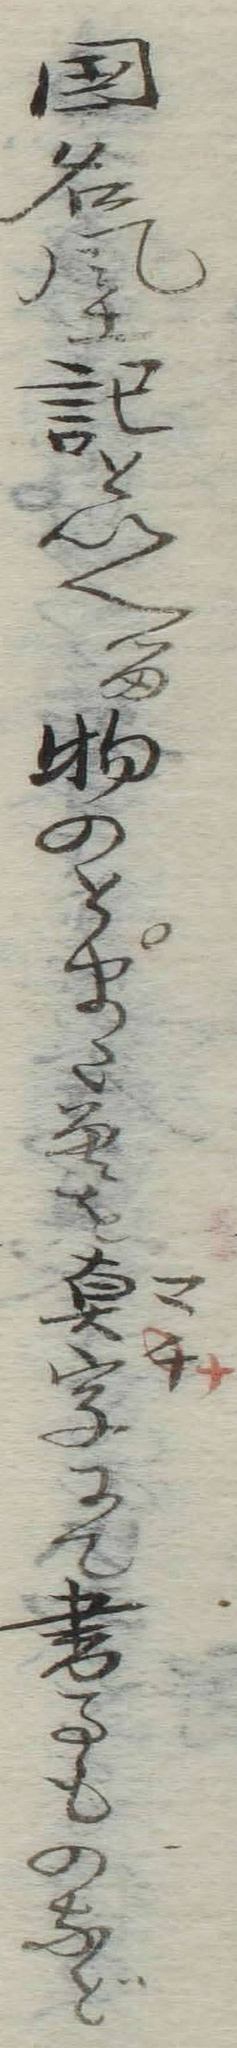国名風土記といへる物のと。またそを真字にて書るものなど
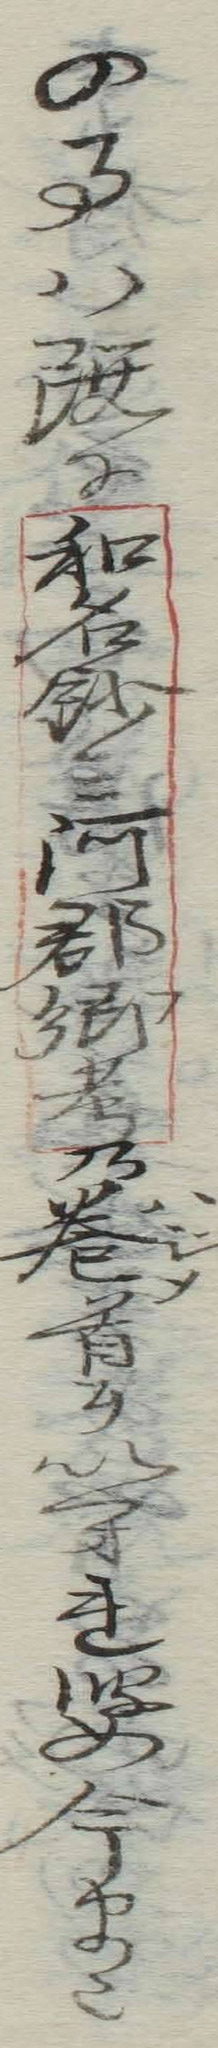の事は既に和名鈔三河郡郷考の巻首にいへれば今また
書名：三河国古跡考
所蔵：国文学研究資料館
